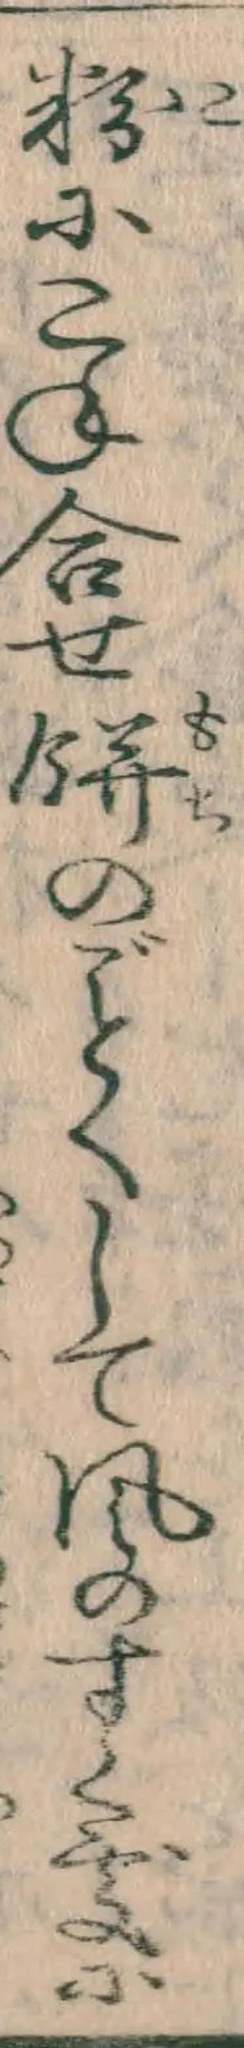粉にこね合せ餅のごとくして風のすく処に
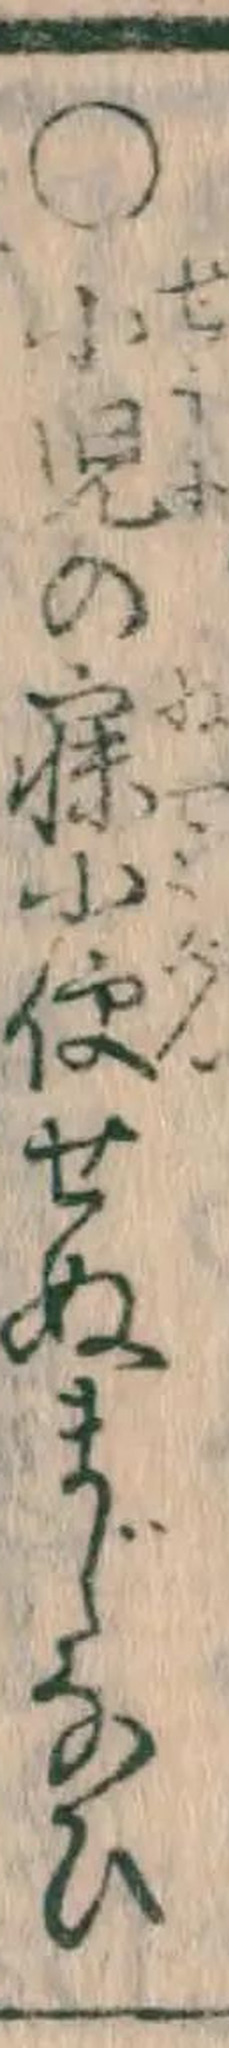○小児の寐小便せぬまじなひ
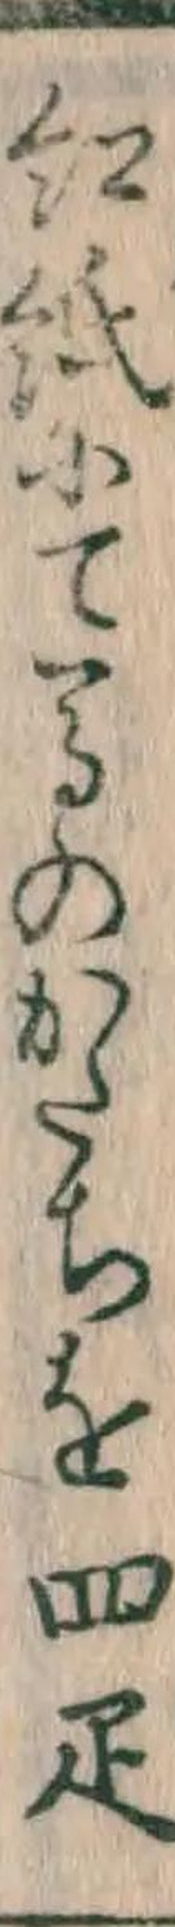紅紙にて馬のかたちを四疋
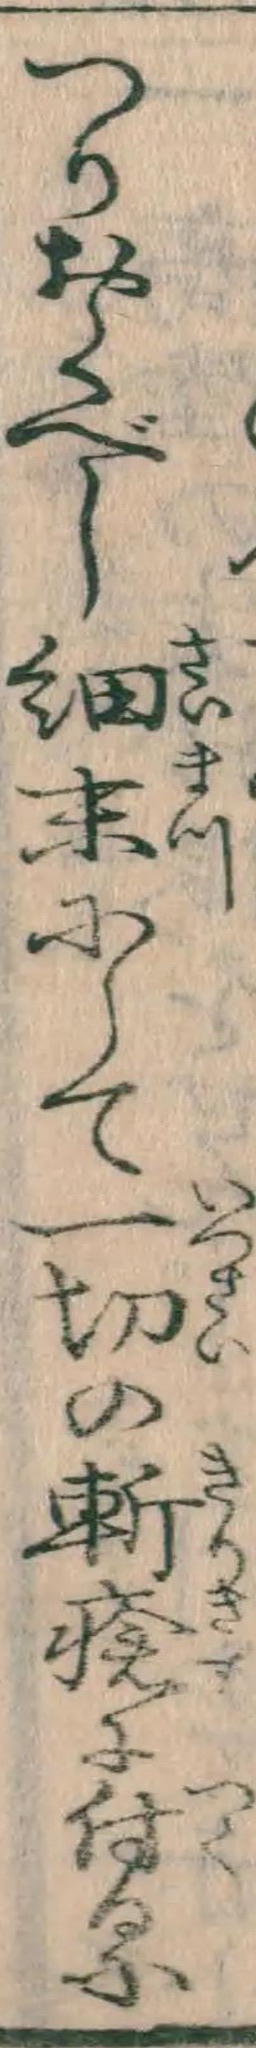つりおくべし細末にして一切の斬瘡に付るに
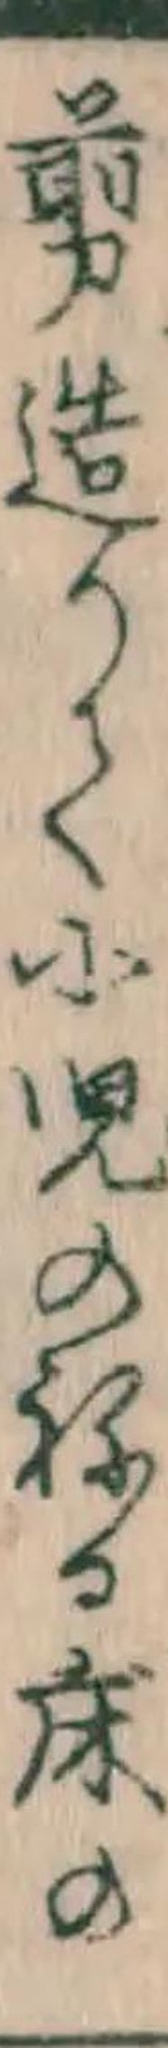剪造りて小児のねる床の
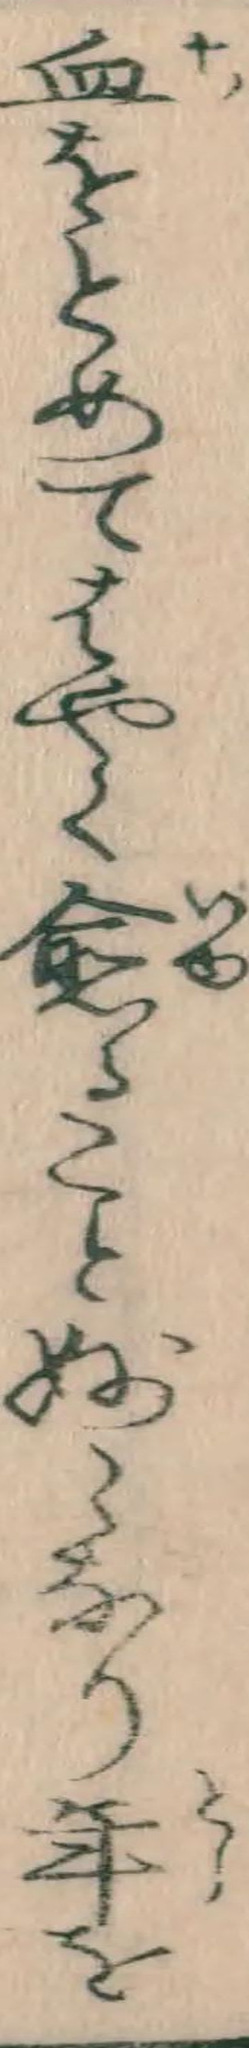血をとめてはやく愈ること妙々なり年を
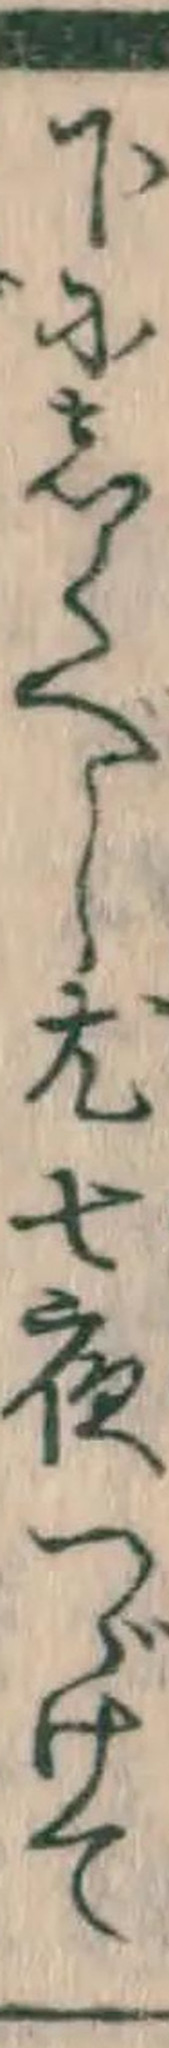下にしくべし尤七夜つゞけて
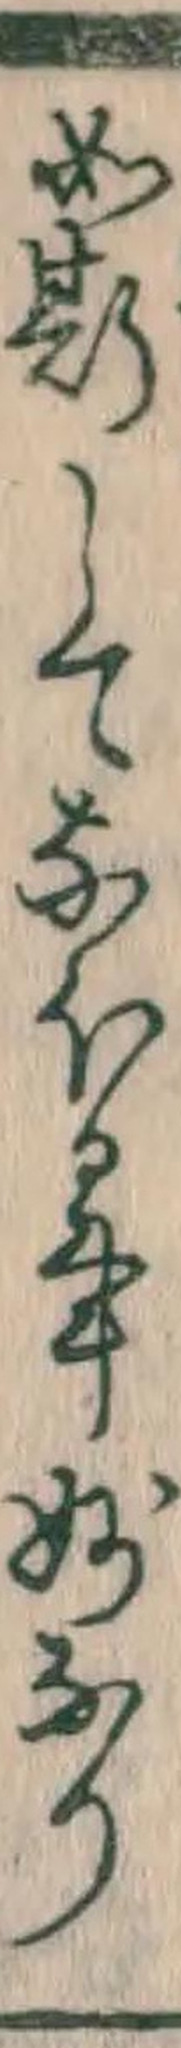如斯してなほる事妙なり
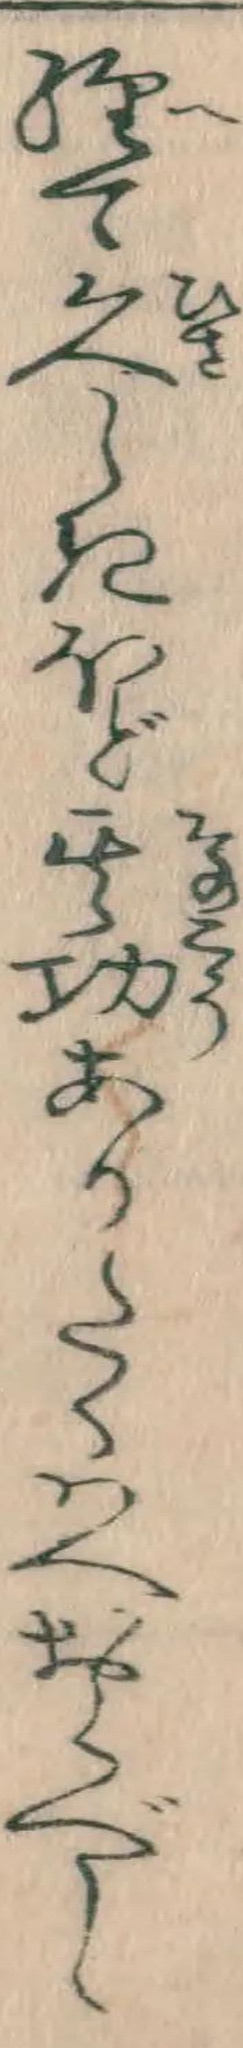経て久しきほど其功ありたくはへおくべし
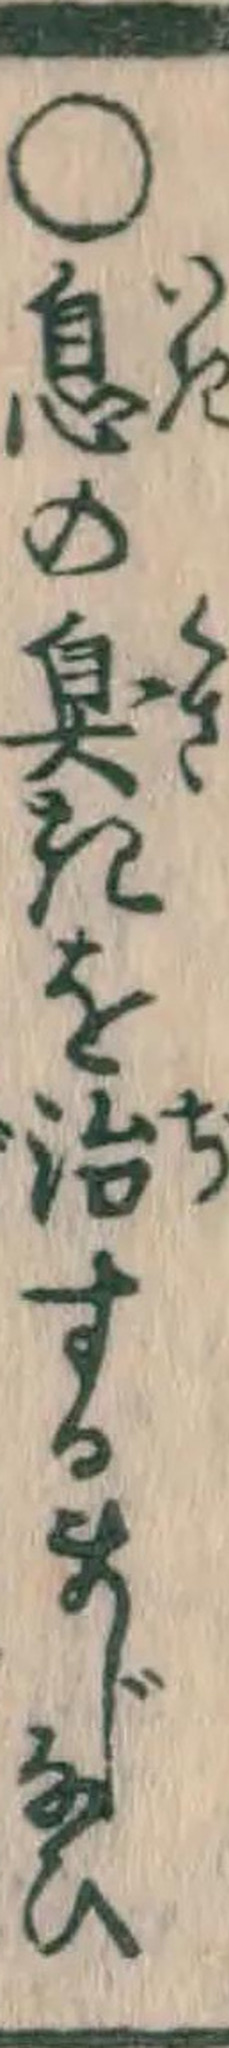○息の臭きを治するまじなひ
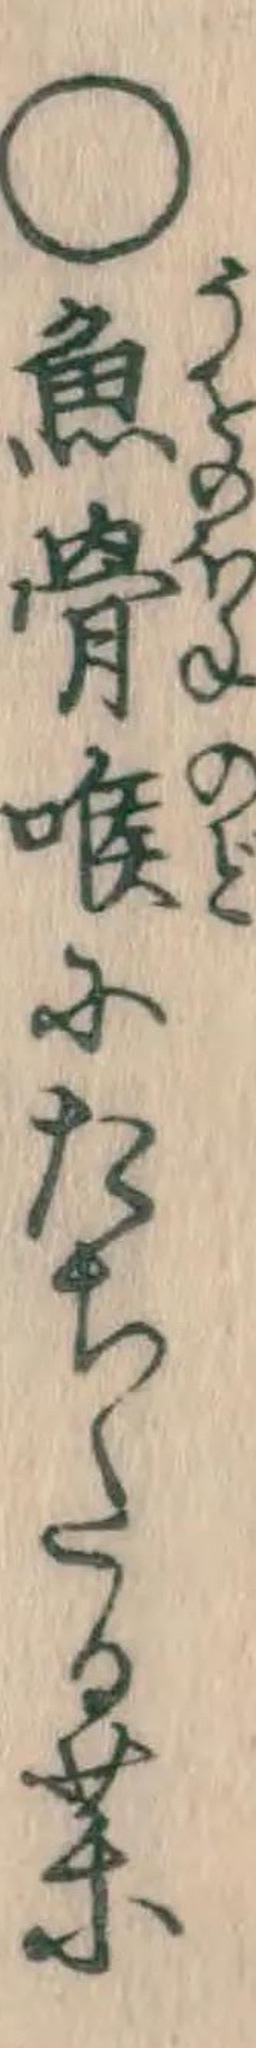○魚骨喉にたちたる薬
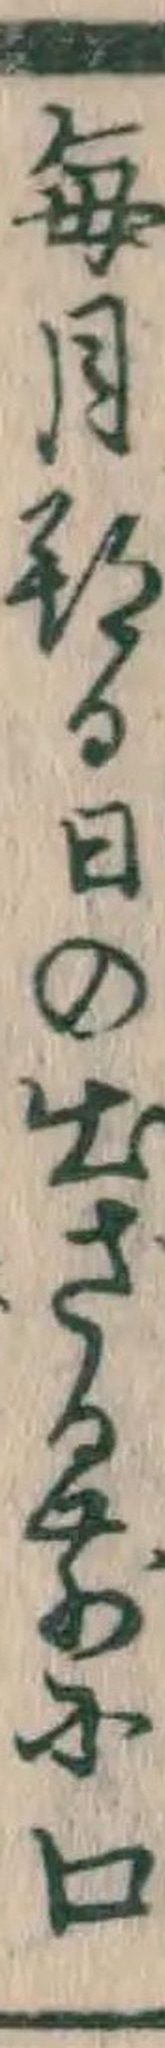毎月朔日日の出ざる前に口
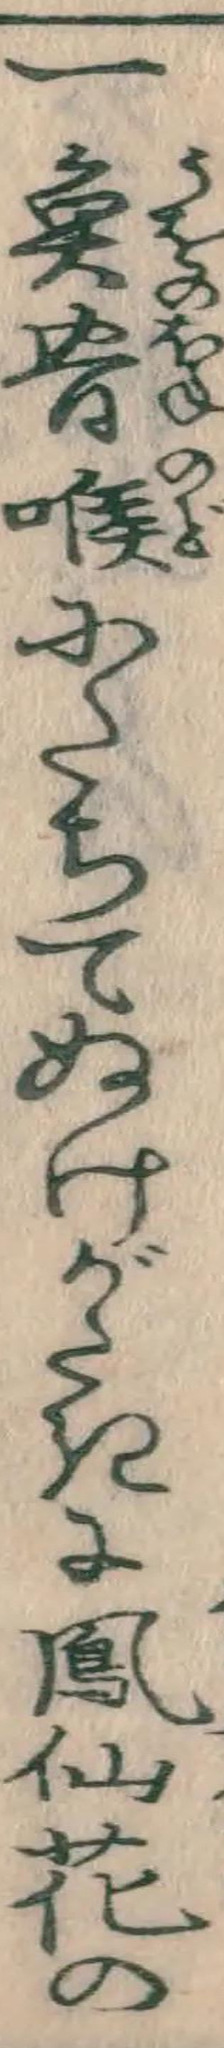一魚骨喉にたちてぬけがたきに鳳仙花の
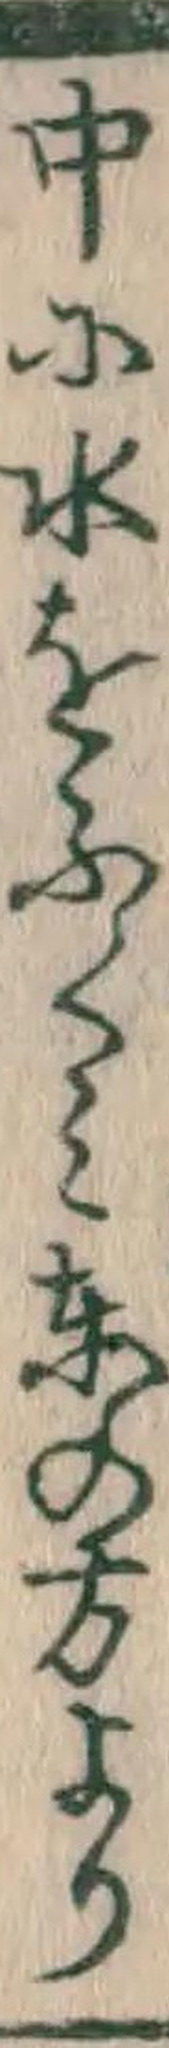中に水をふくみ東の方より
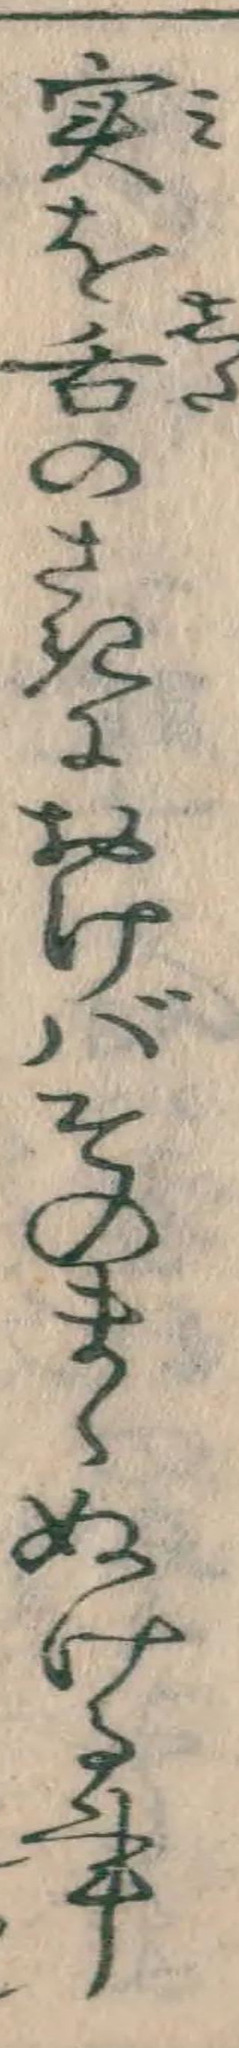実を舌のさきにおけばそのまゝぬける事
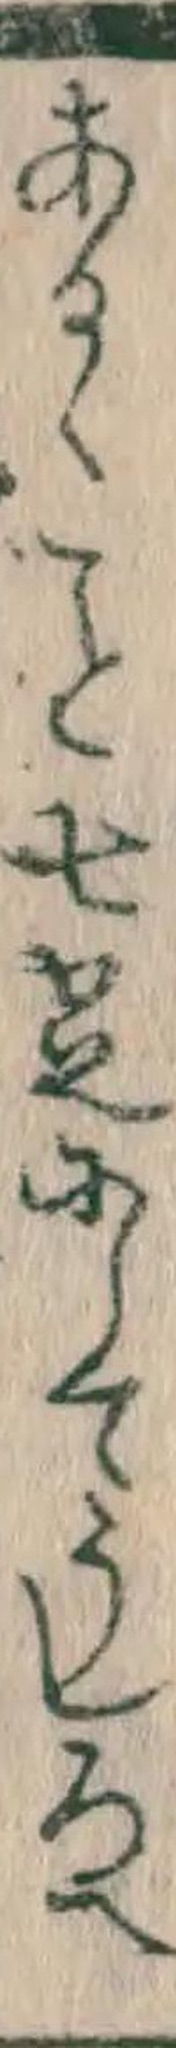あるくこと七足にしてうしろへ
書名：広益秘事大全 3巻. [4]
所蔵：国立国会図書館 National Diet Library, JAPAN
